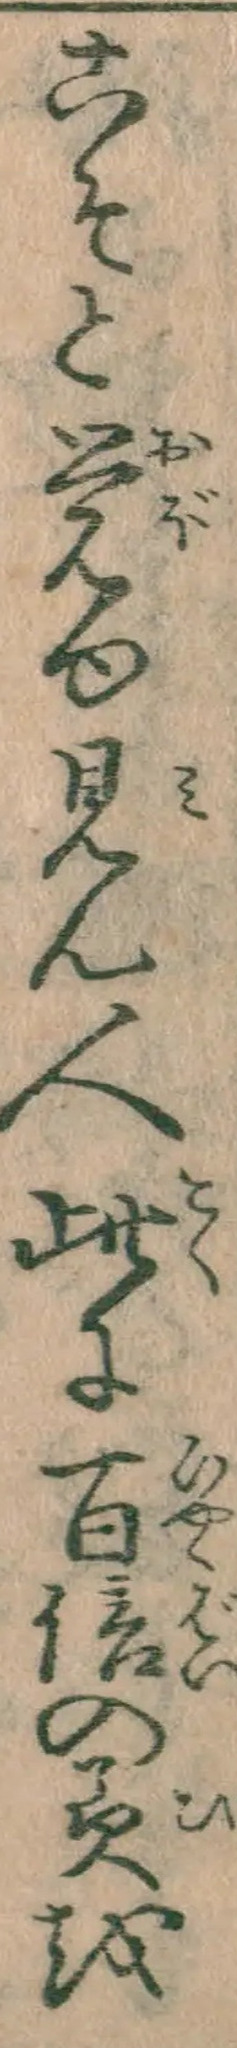こそと覚ゆ見ん人此に百倍の美を
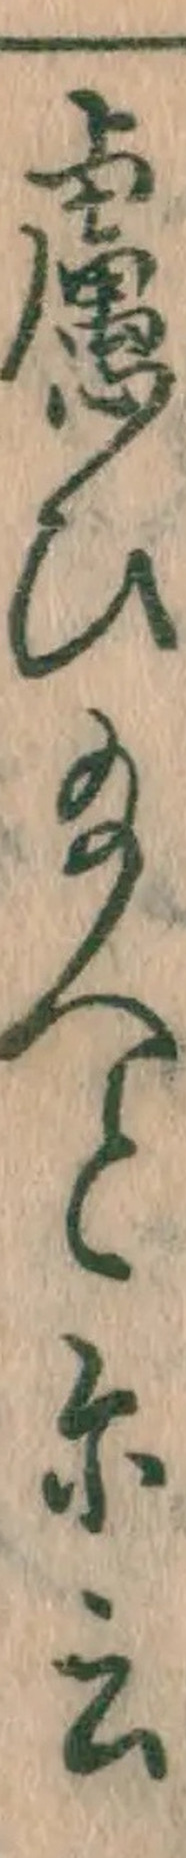ひ給へと尓云
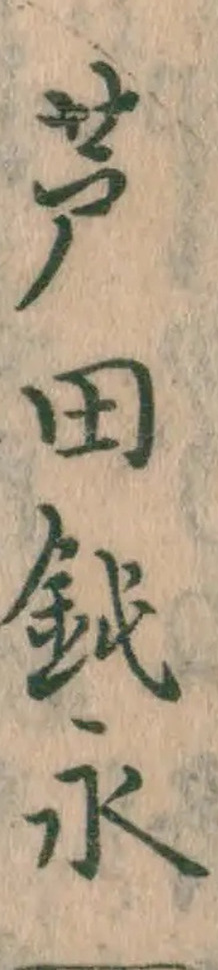芦田鈍永
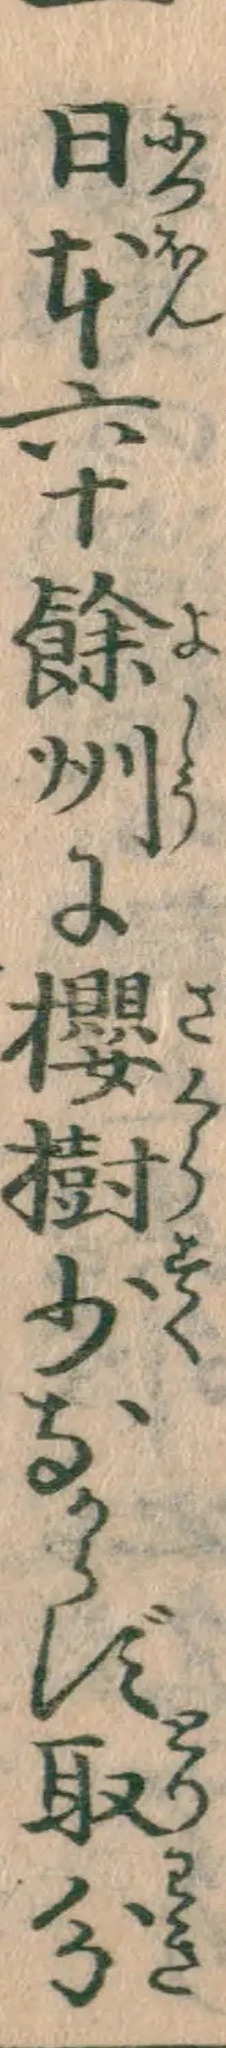一日本六十余州に桜樹少なからず取分
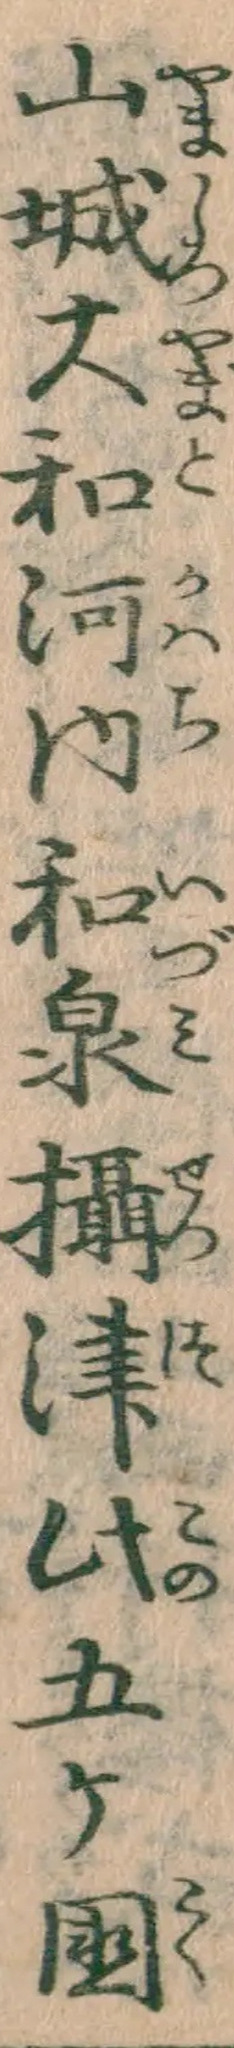山城大和河内和泉摂津此五ヶ国
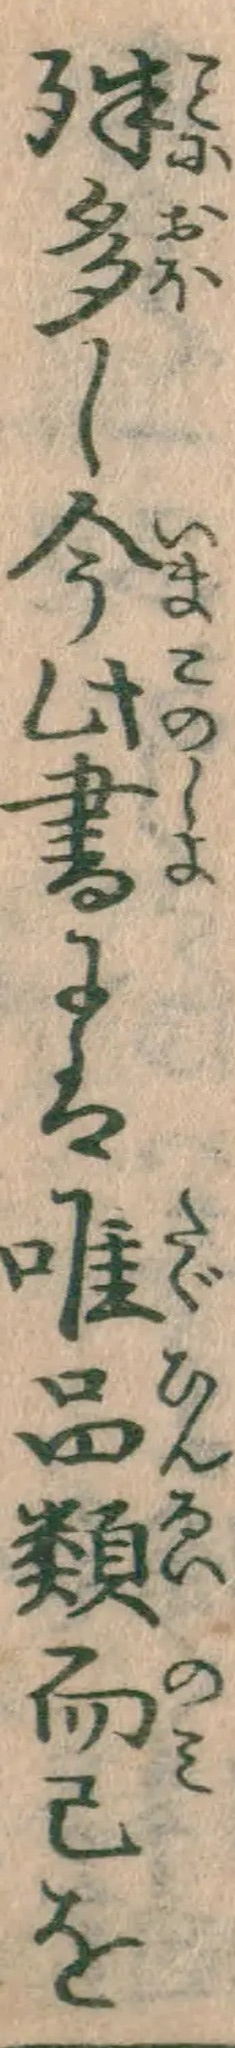殊多し今此書には唯品類而已を
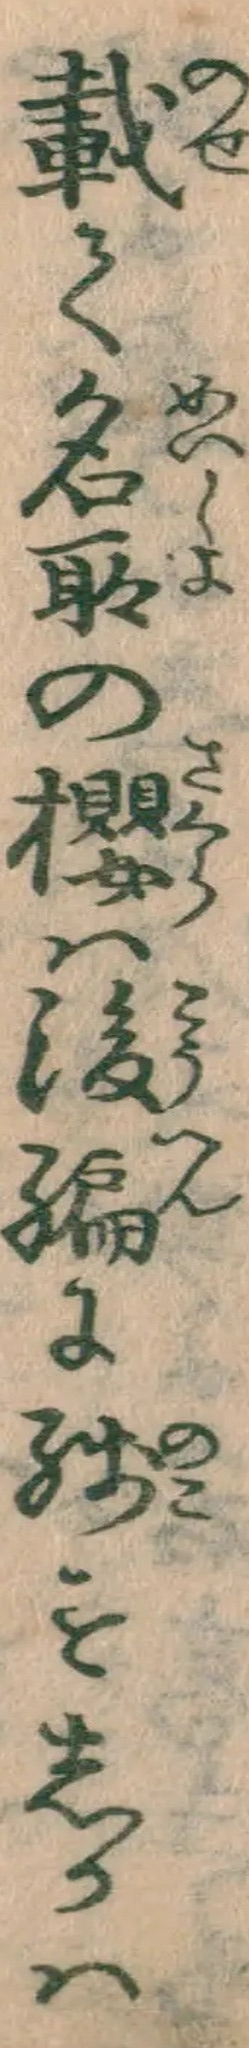載て名所の桜は後編に残すしかは
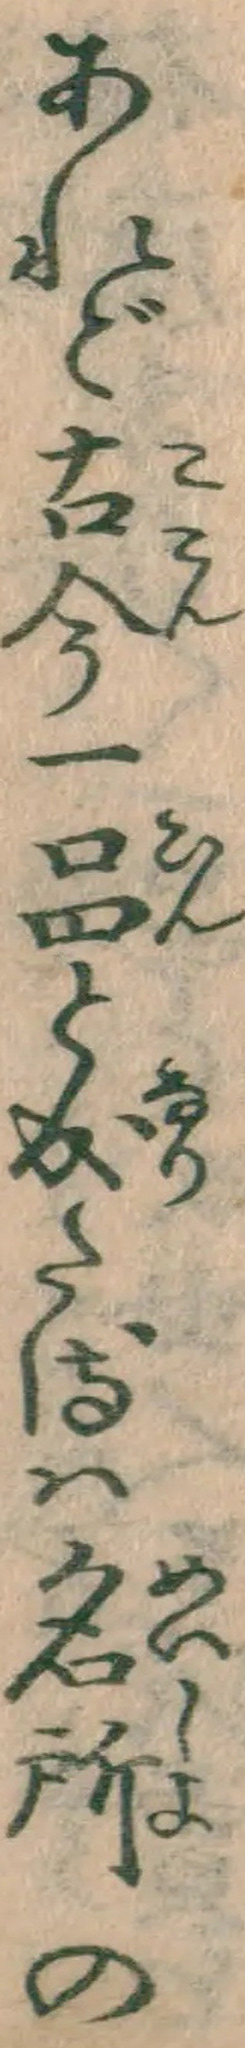あれど古今一品と成たるは名所の
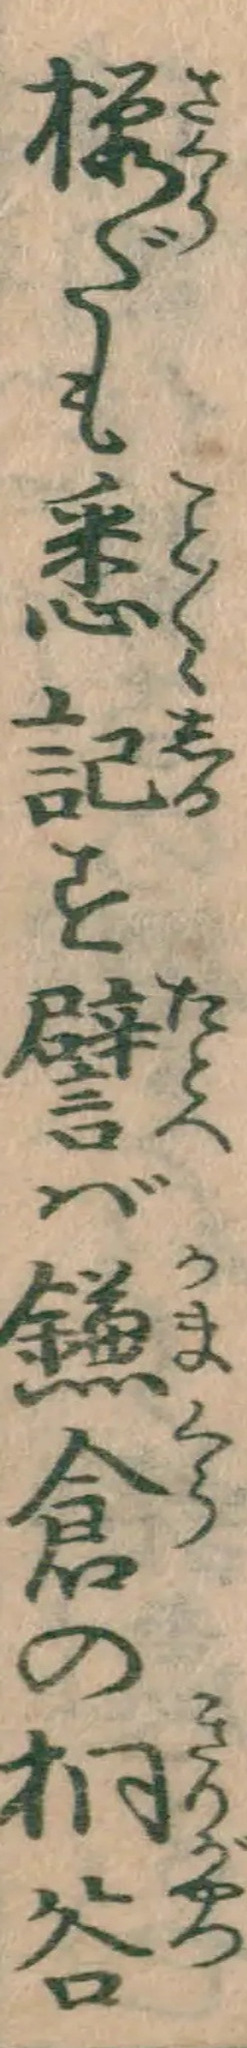桜だも悉記す譬ば鎌倉の桐谷

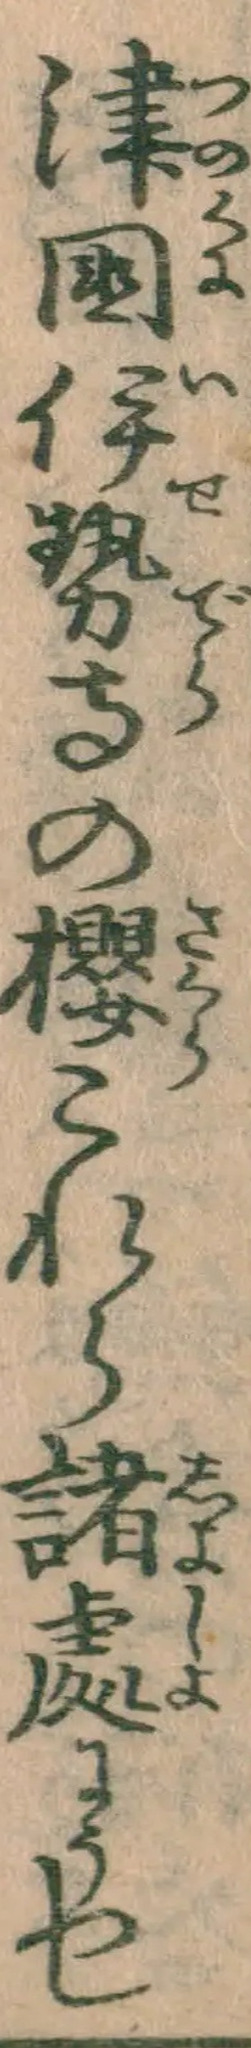津国伊勢寺の桜これら諸処にうつし
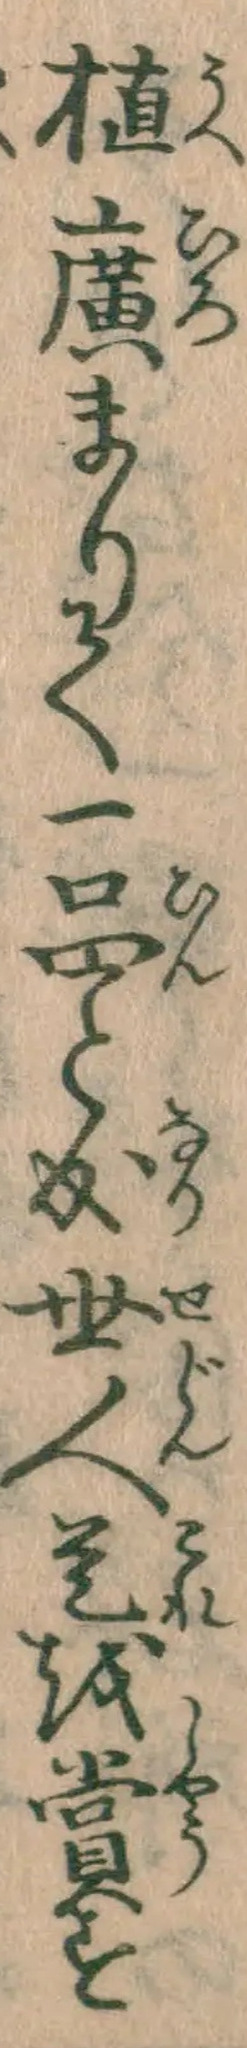植広まりて一品と成世人是を賞す
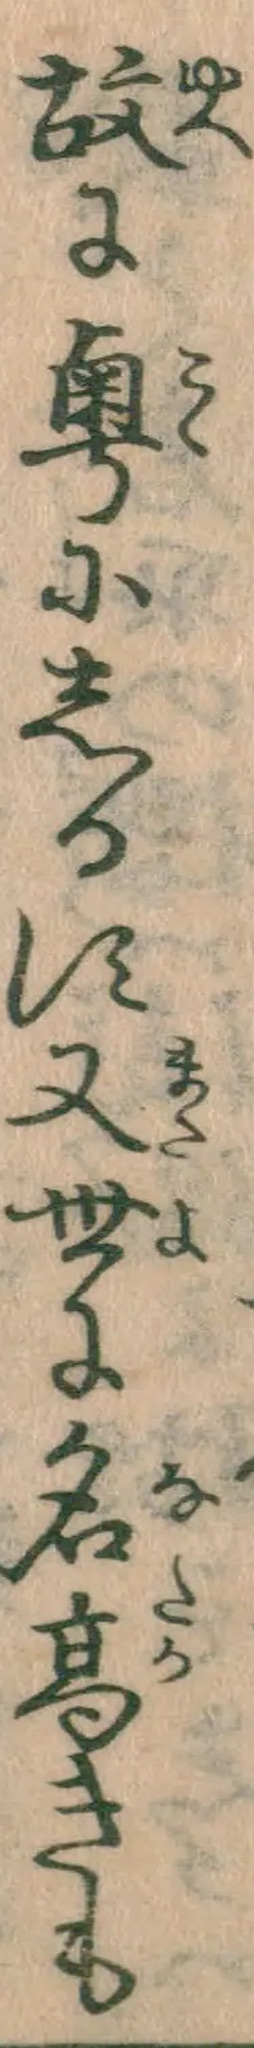故に粤にしるす又世に名高きも
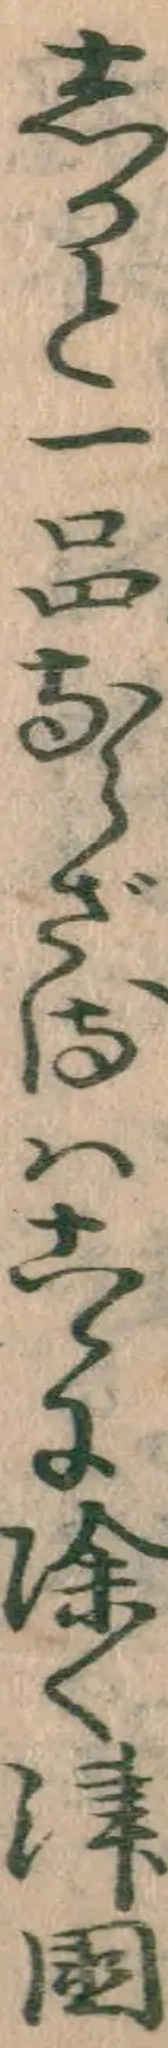しかと一品ならざるはこゝに除く津国
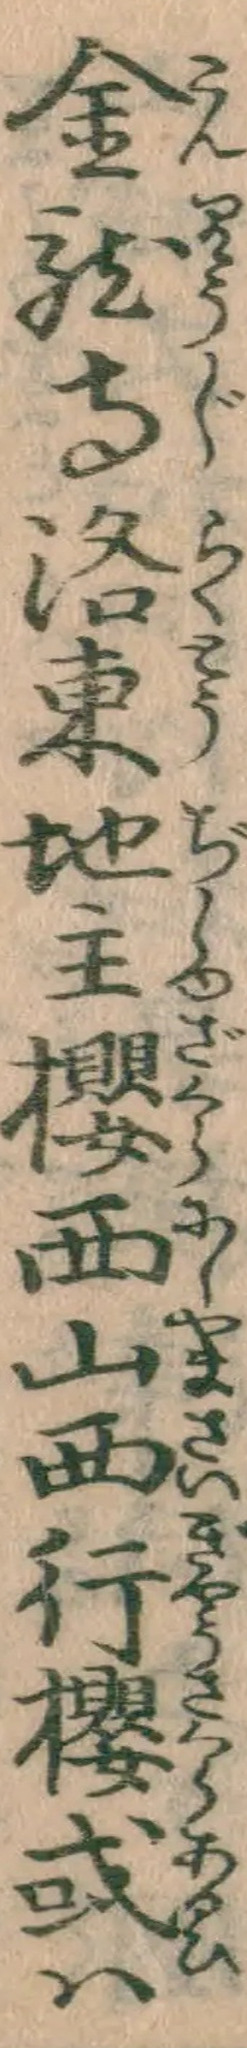金龍寺洛東地主桜西山西行桜或は
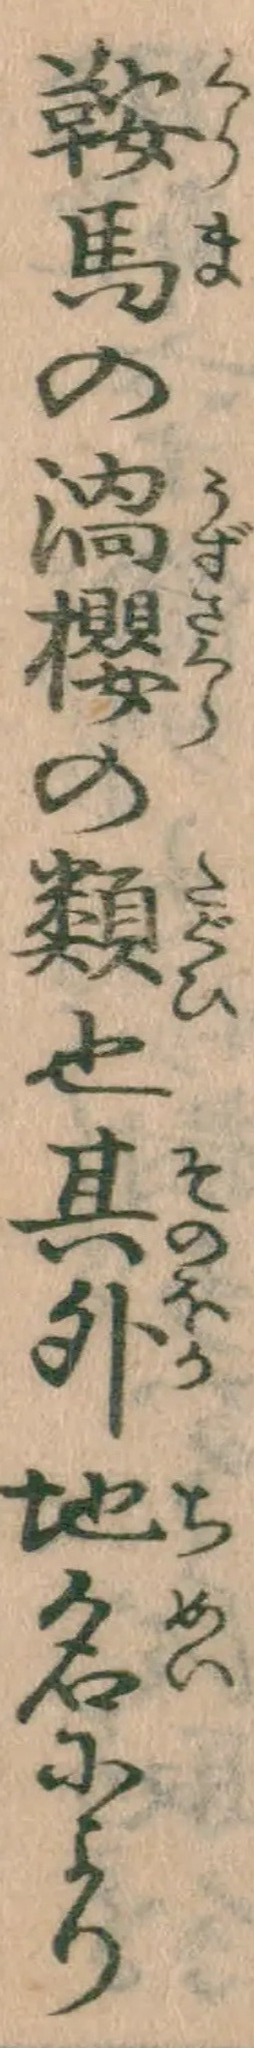鞍馬の渦桜の類也其外地名により
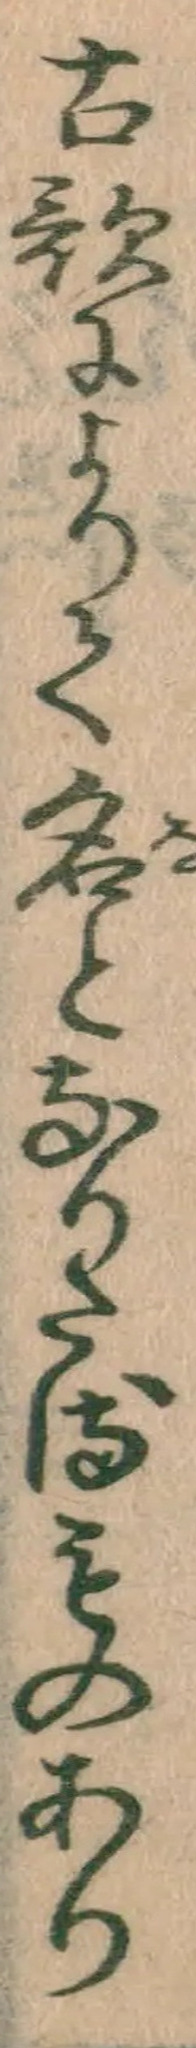古歌によりて名となりたるものあり
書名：怡顔齋櫻品
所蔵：国立国会図書館 National Diet Library, JAPAN
